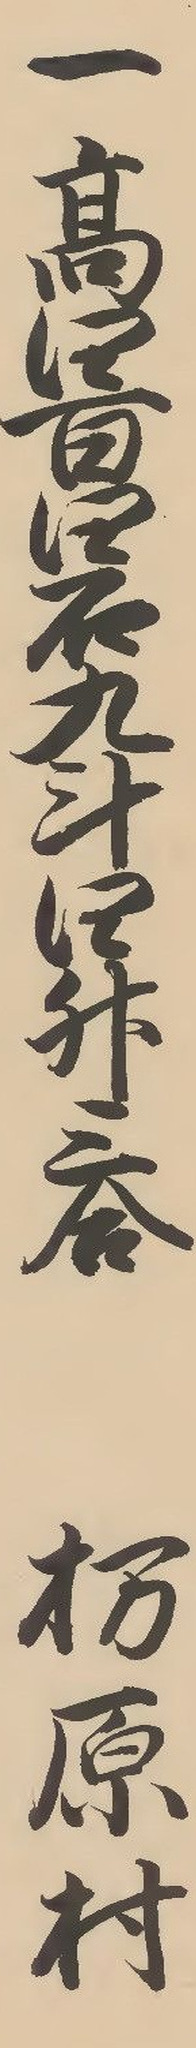一髙四百四石九斗四升三合杤原村
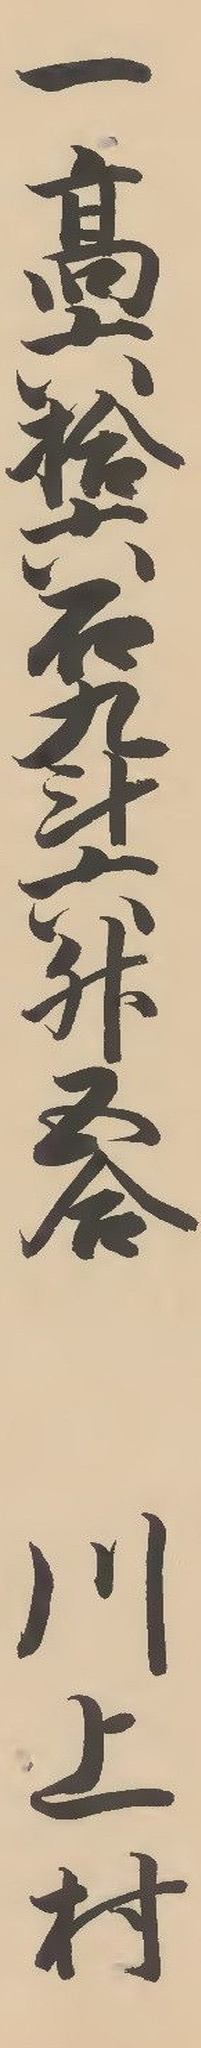一髙六拾六石九斗六升五合川上村
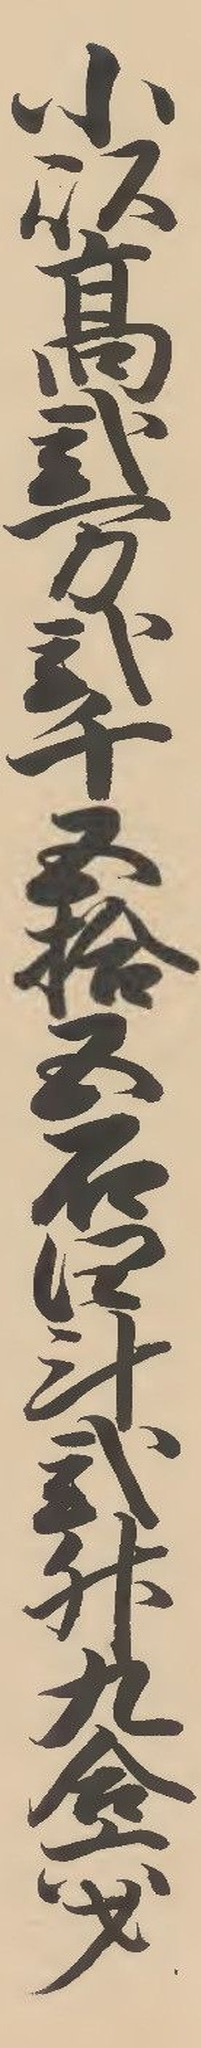小以髙弐万弐千五拾五石四斗弐升九合六才
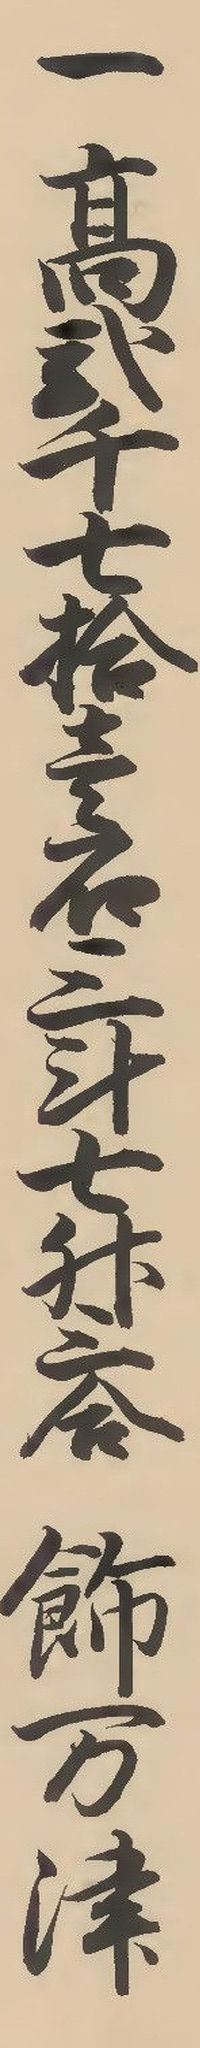一髙二千七拾壱石三斗七升三合飾万津
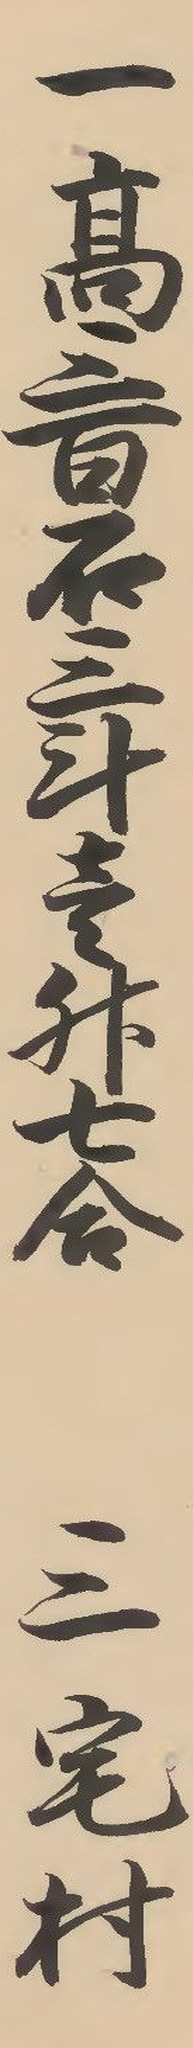一髙三百石三斗壱升七合三宅村
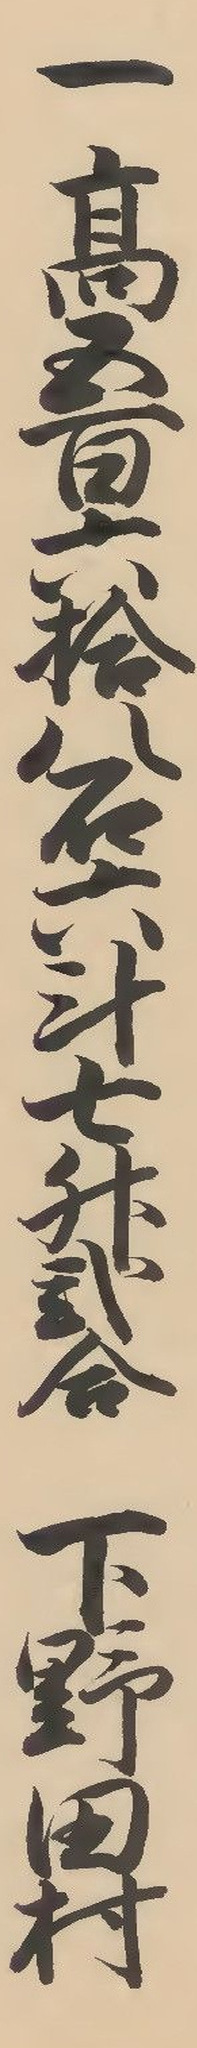一髙五百六拾八石六斗七升弐合下野田村

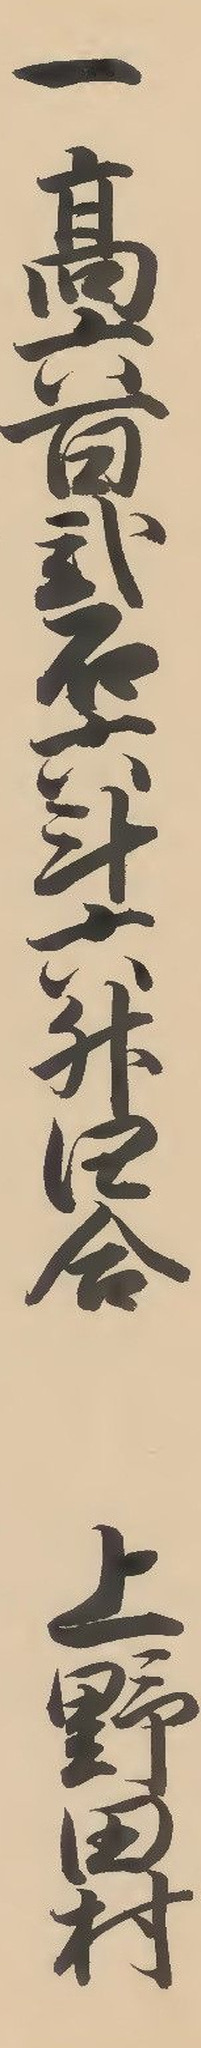一髙六百弐石六斗六升四合上野田村
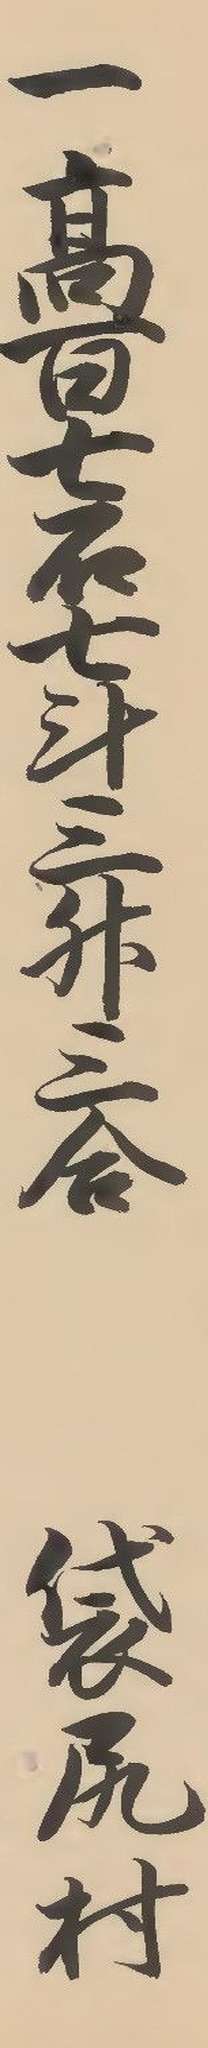一髙百七石七斗三升三合袋尻村
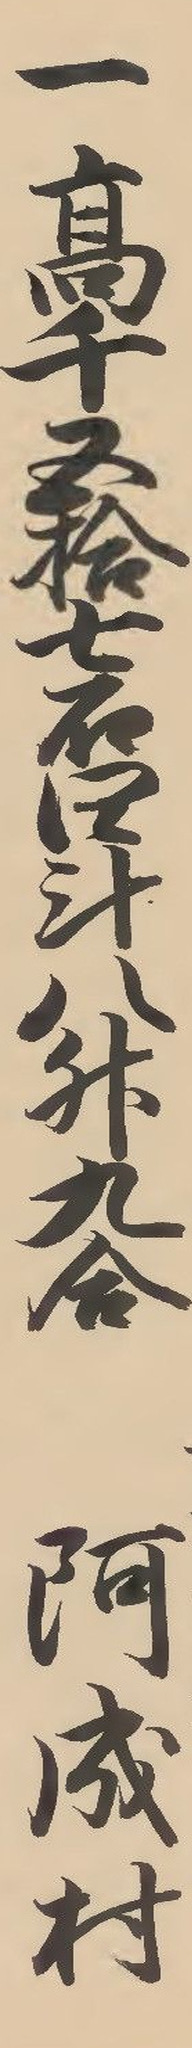一髙千五拾七石四斗八升九合阿成村
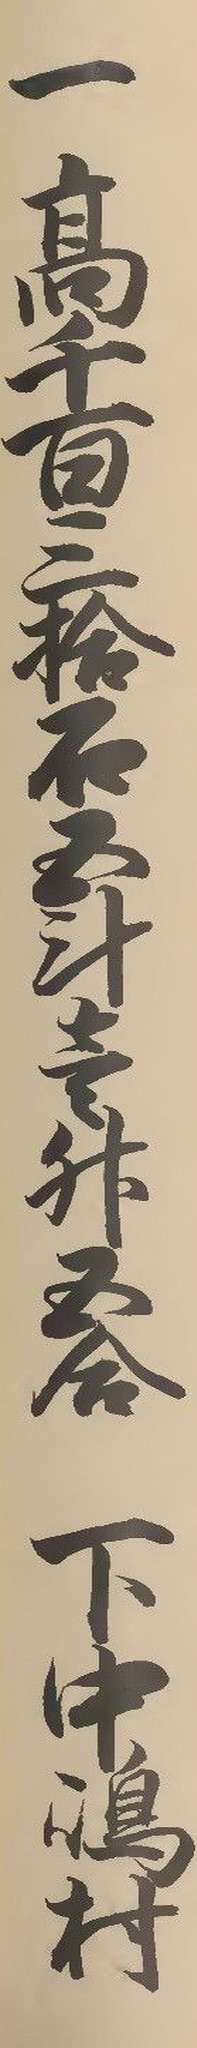一髙千百三拾石五斗壱升五合下中嶋村
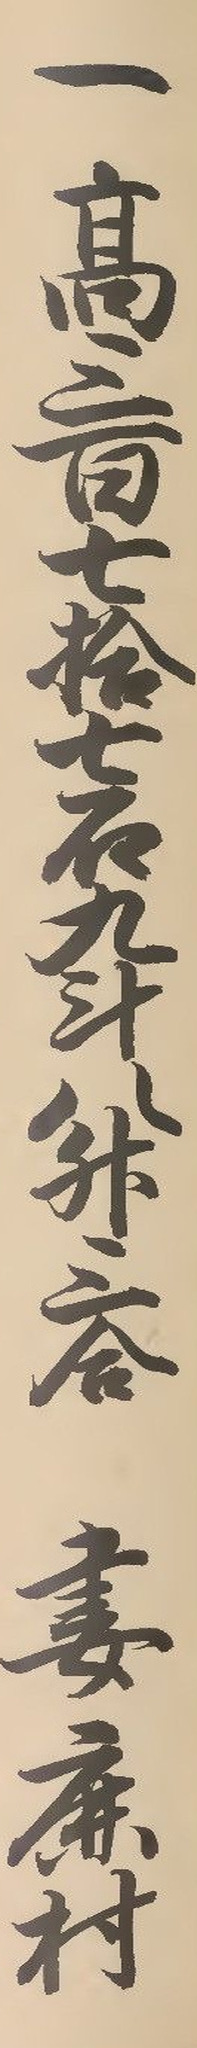一髙三百七拾七石九斗八升三合妻鹿村
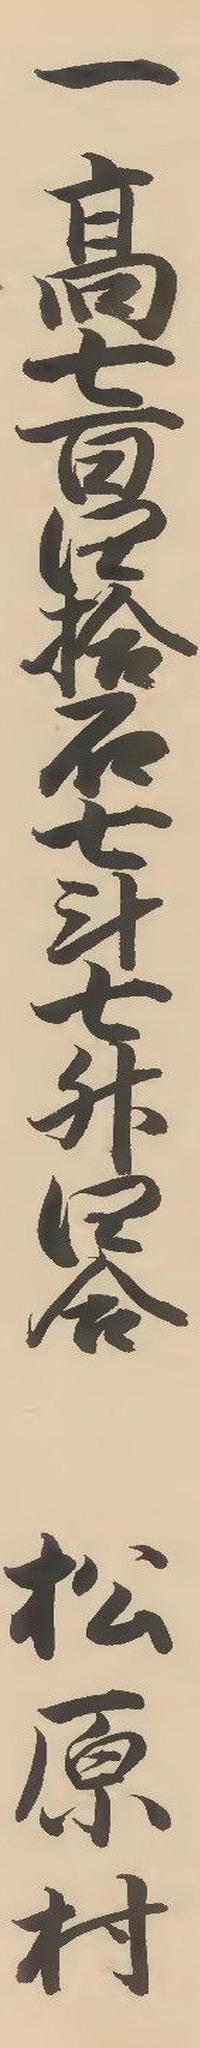一髙七百四拾石七斗七升四合松原村
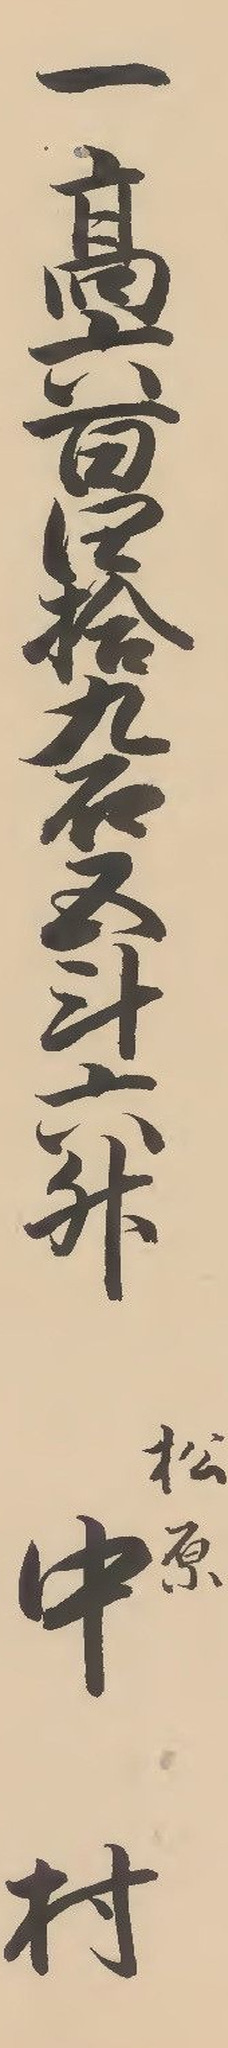一髙六百四拾九石五斗六升中村
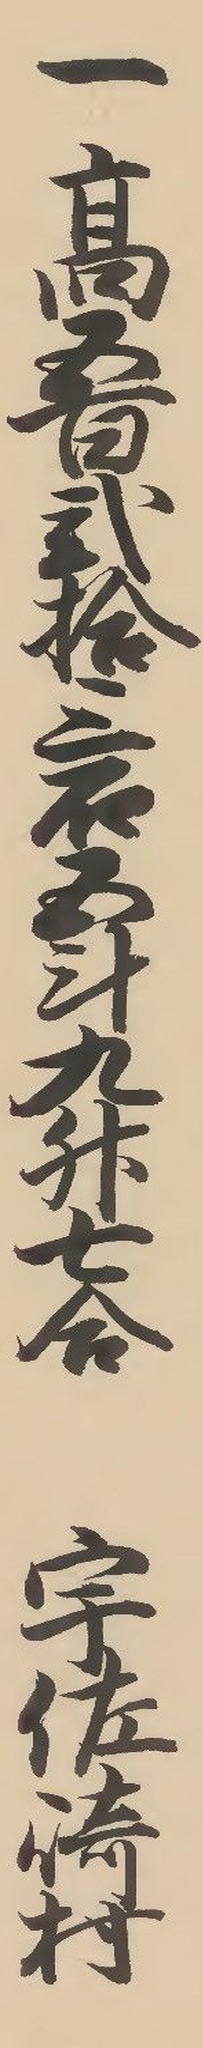一髙五百弐拾三石五斗九升七合宇佐崎村

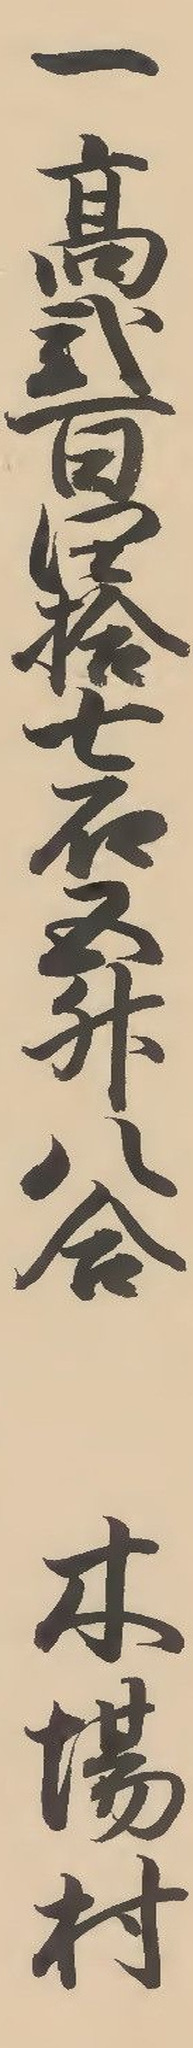一髙弐百四拾七石五升八合木場村
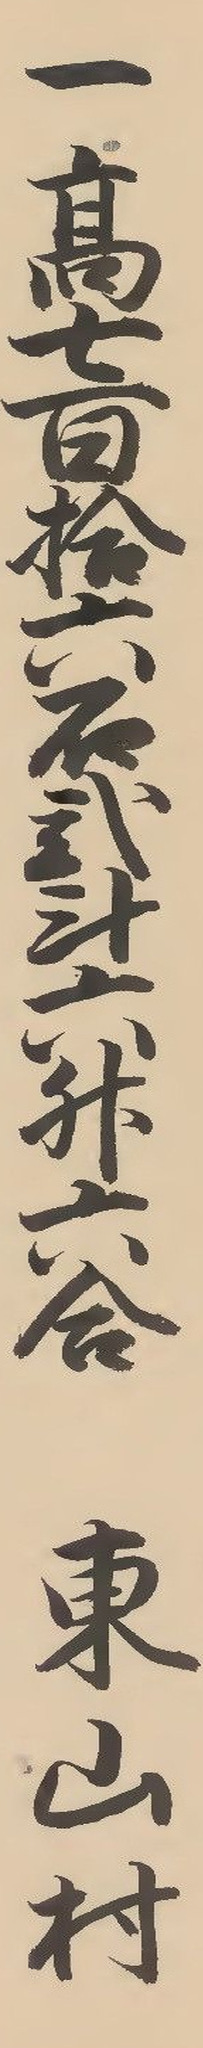一髙七百拾六石弐斗六升六合東山村
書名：播磨国郷帳
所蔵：国立公文書館 National Archives of Japan
